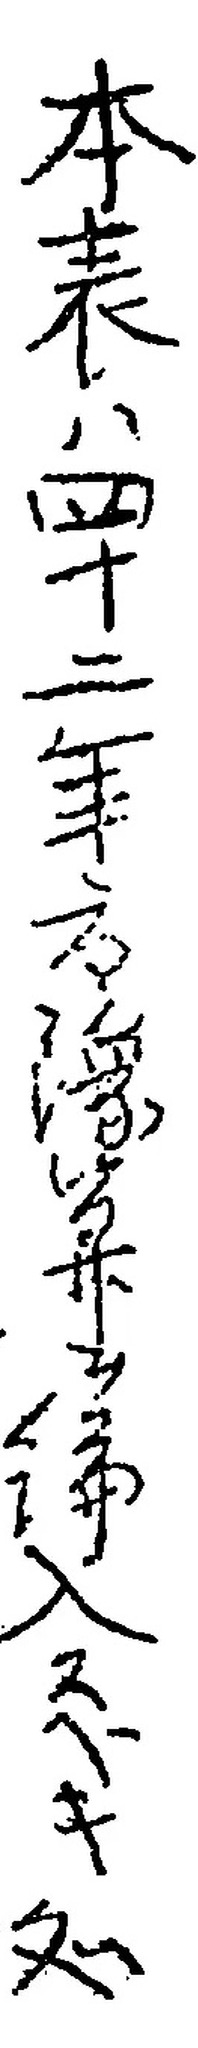本表ハ四十二年度豫算ヲ編入スベキ処
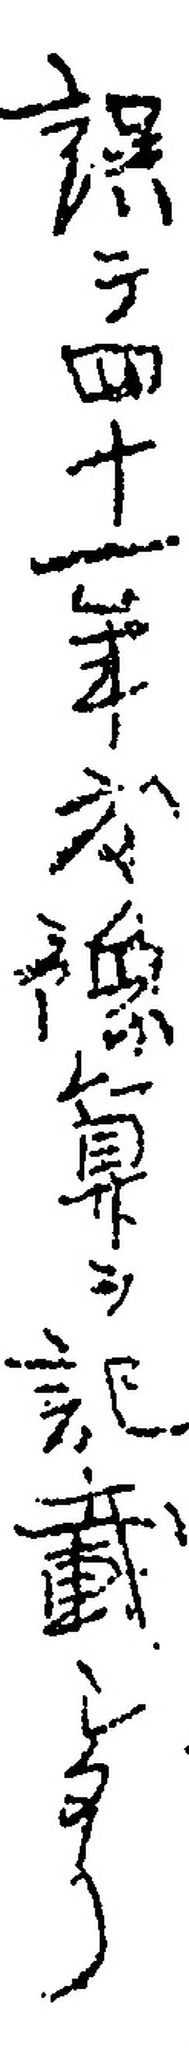誤テ四十一年度豫算ヲ記載シタリ

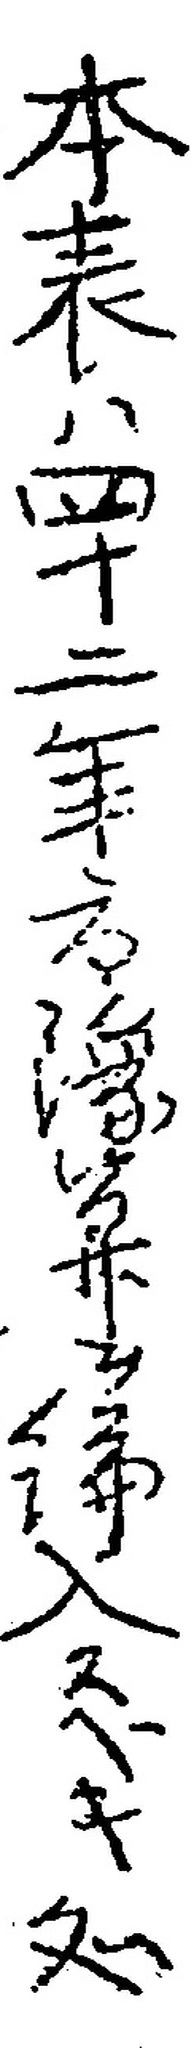本表ハ四十二年度豫算ヲ編入スベキ処
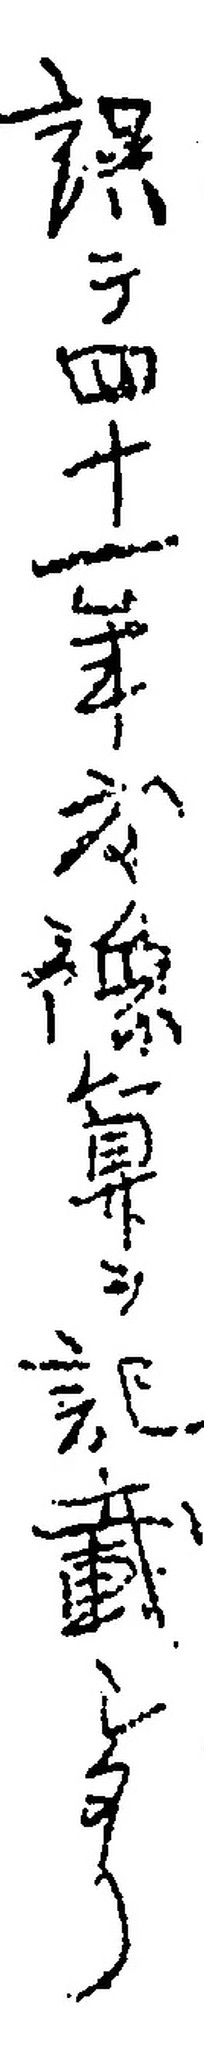誤テ四十一年度豫算ヲ記載シタリ

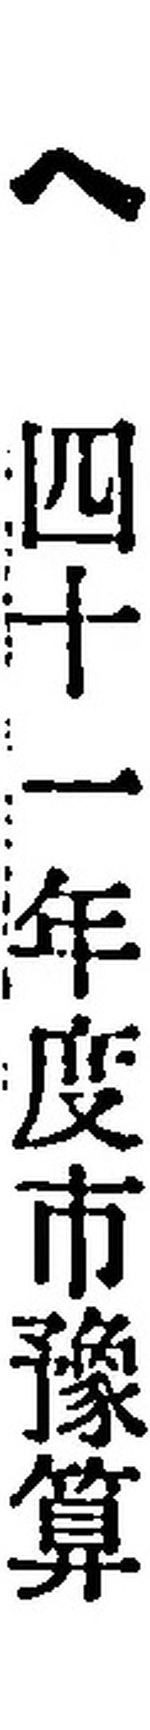ヘ四十一年度市豫算

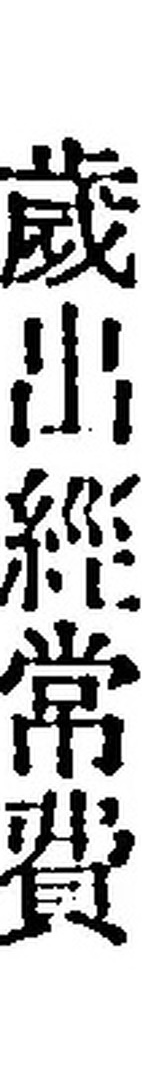歲出経常費
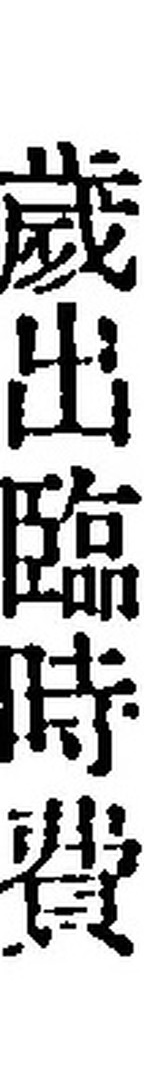歲出臨時費
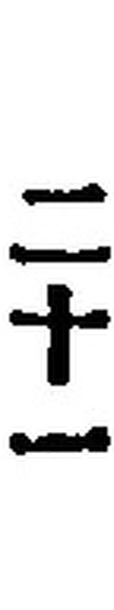二十一

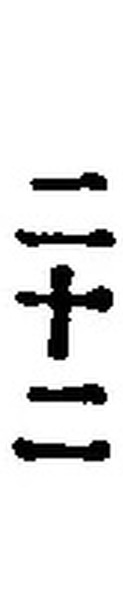二十二
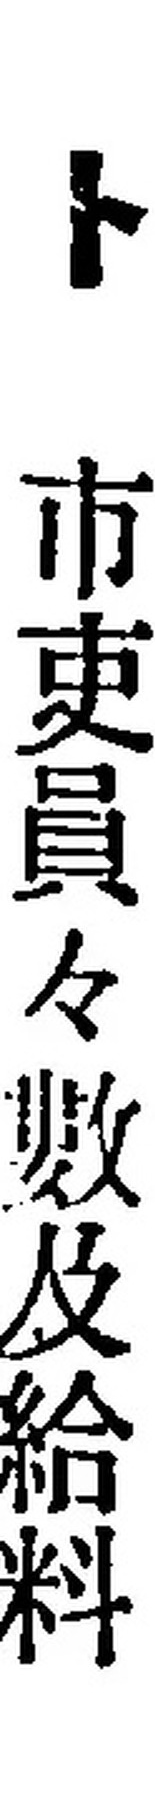ト市吏員々數及給料
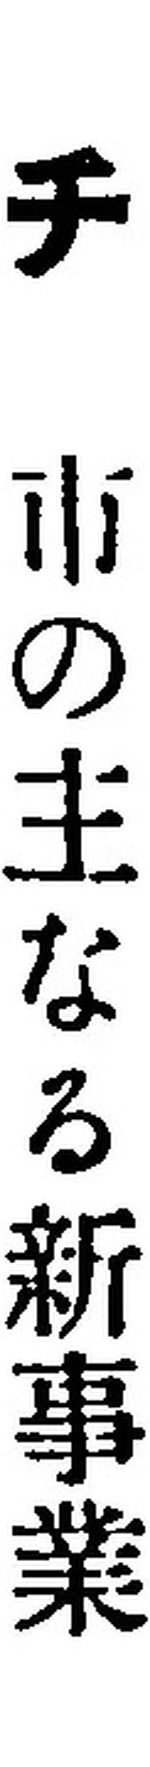チ市の主なる新事業
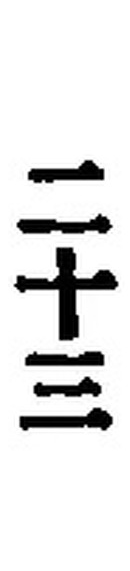二十三

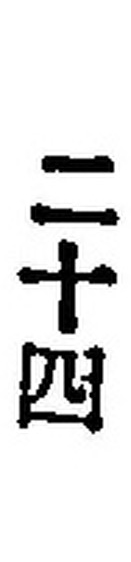二十四
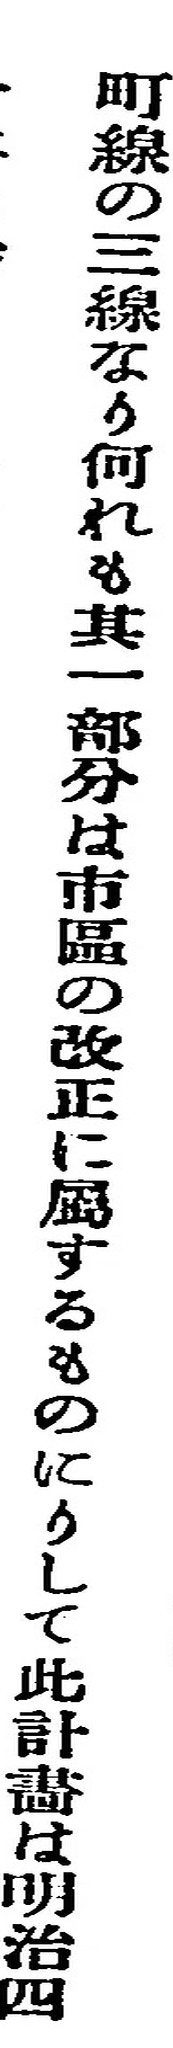町線の三線なり何れも其一部分は市區の改正に屬するものにりして此計畵は明治四
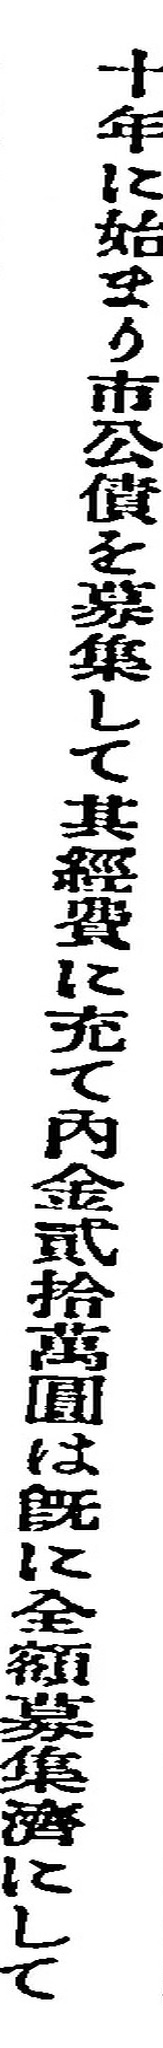十年に始まり市公債を募集して其經費に充て内金貳拾萬圓は旣に全額募集濟にして
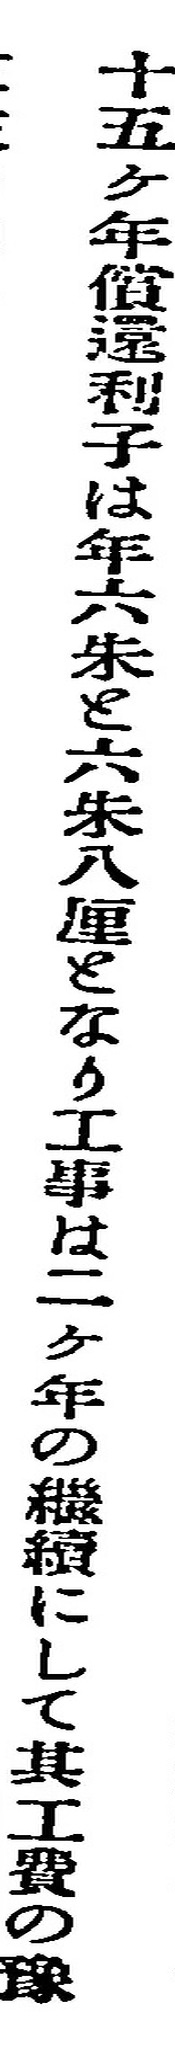十五ヶ年償還利子は年六朱と六朱八厘となり工事は二ヶ年の繼續にして其工費の豫
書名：豊橋志要
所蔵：国立国会図書館 National Diet Library, JAPAN
